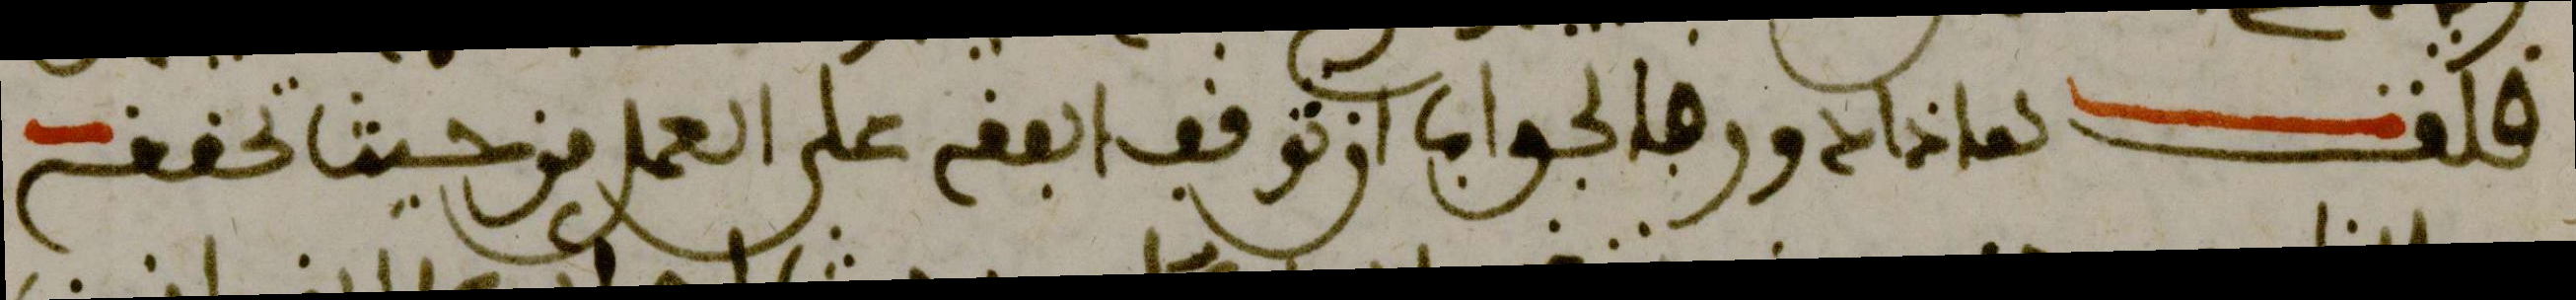قلت هاذا دور فالجواب ان توقف الفقه على العمل من حيث تحققه
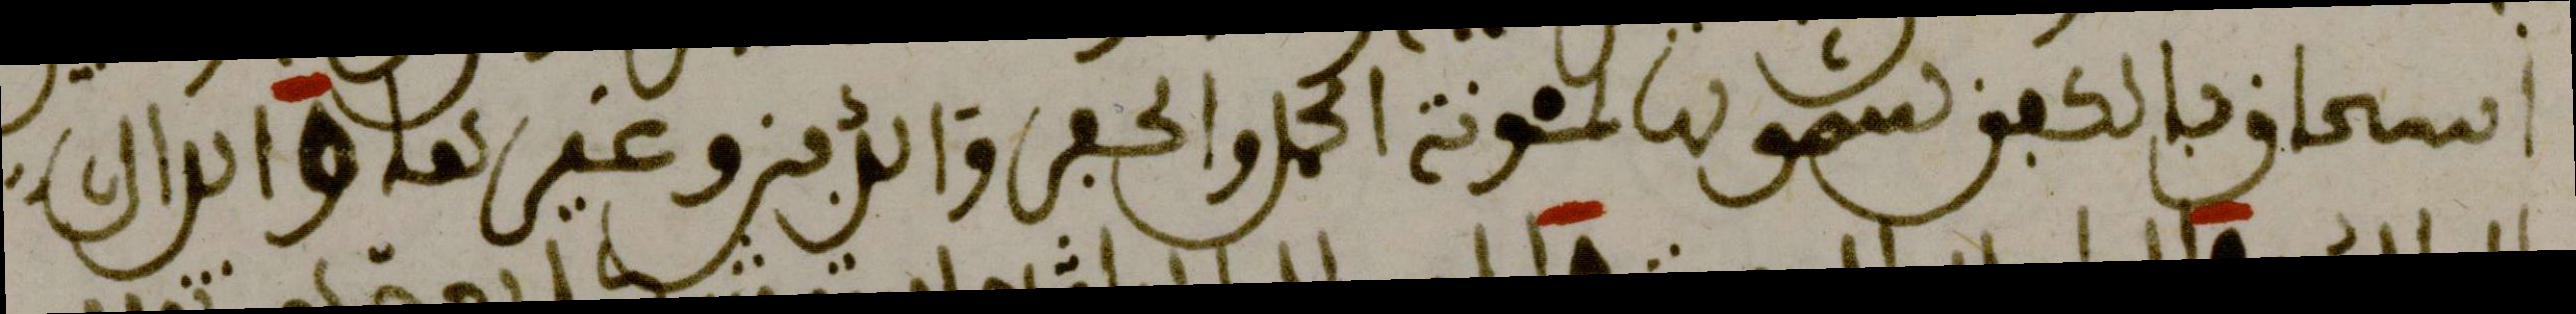اسحاق بالكفن لشمولها المؤنة الحمل والحفر والدفن وغيرها وَالدال
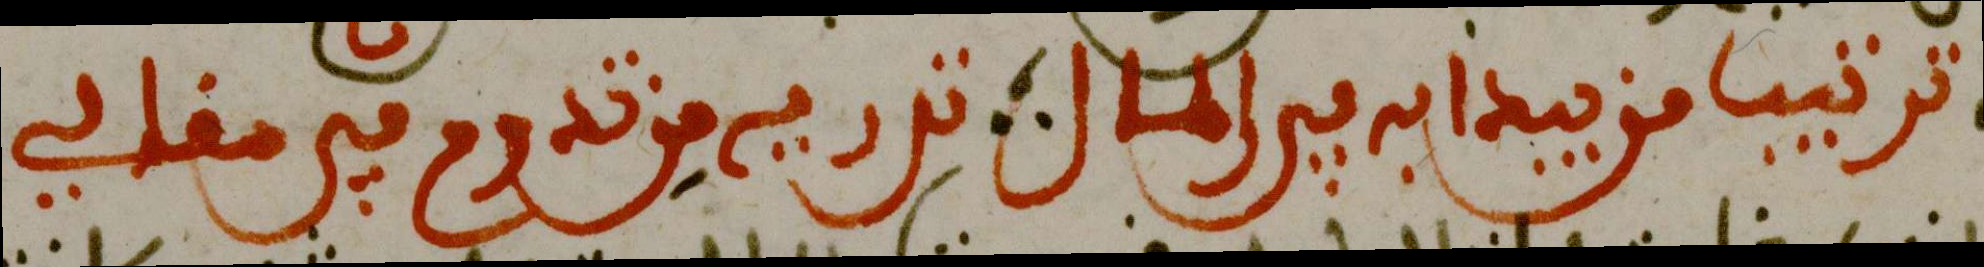ترتيب من يبدا به في المال تدريه مِن تدوم في مقالي
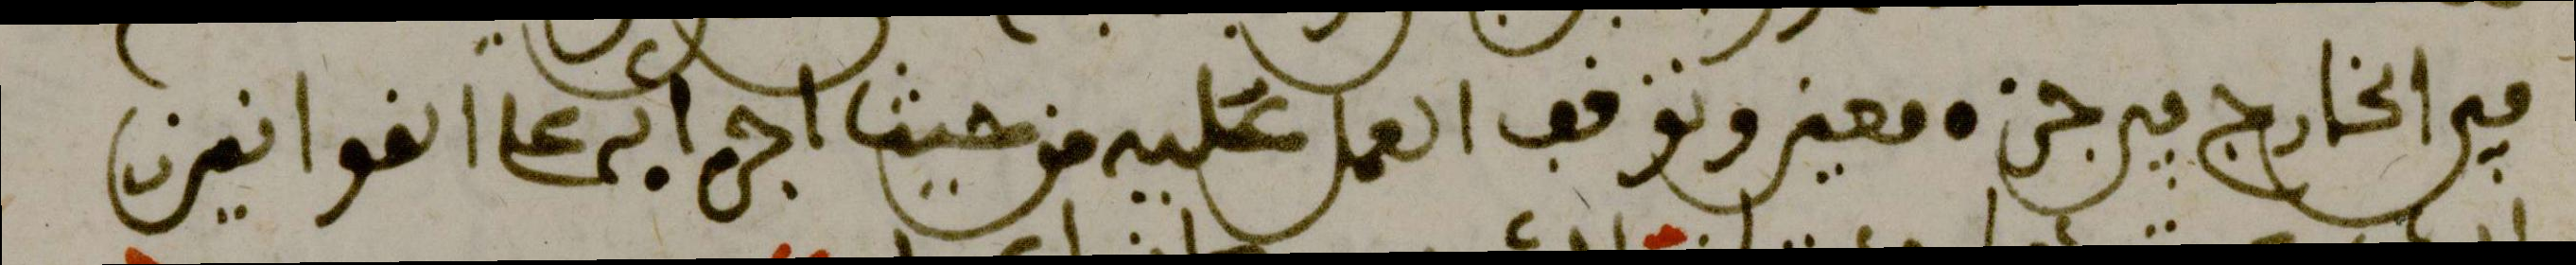في الخارج في جزء معين وتوقف العمل عَليه من حيث اجرائه على القوانين
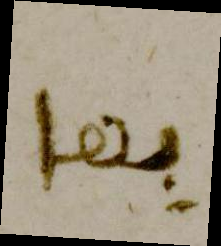بها
